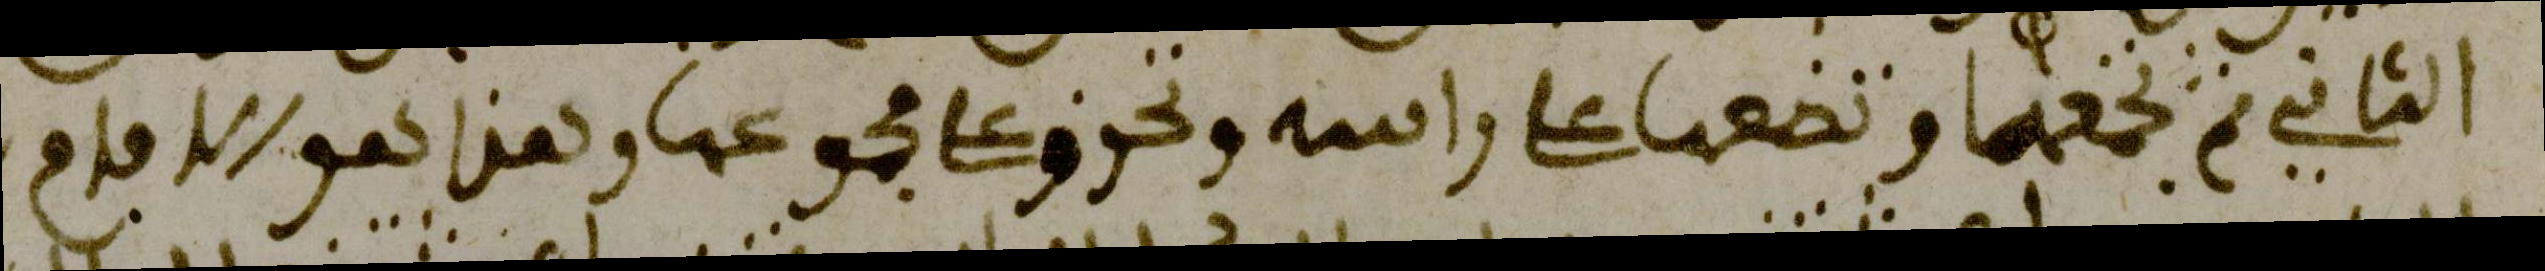الثاني ثم تجمعها وتضعها على راسه وتحوق على مجموعها وهذا هو الامام
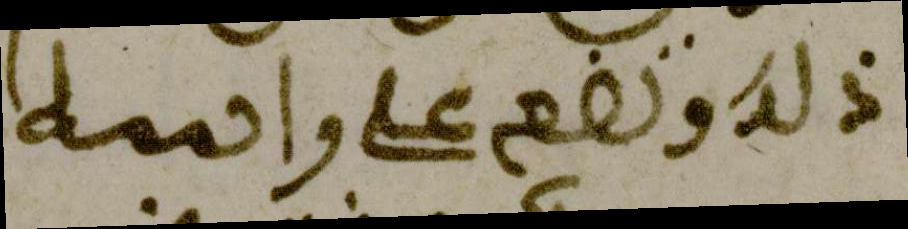ذلك وتضع على راسه
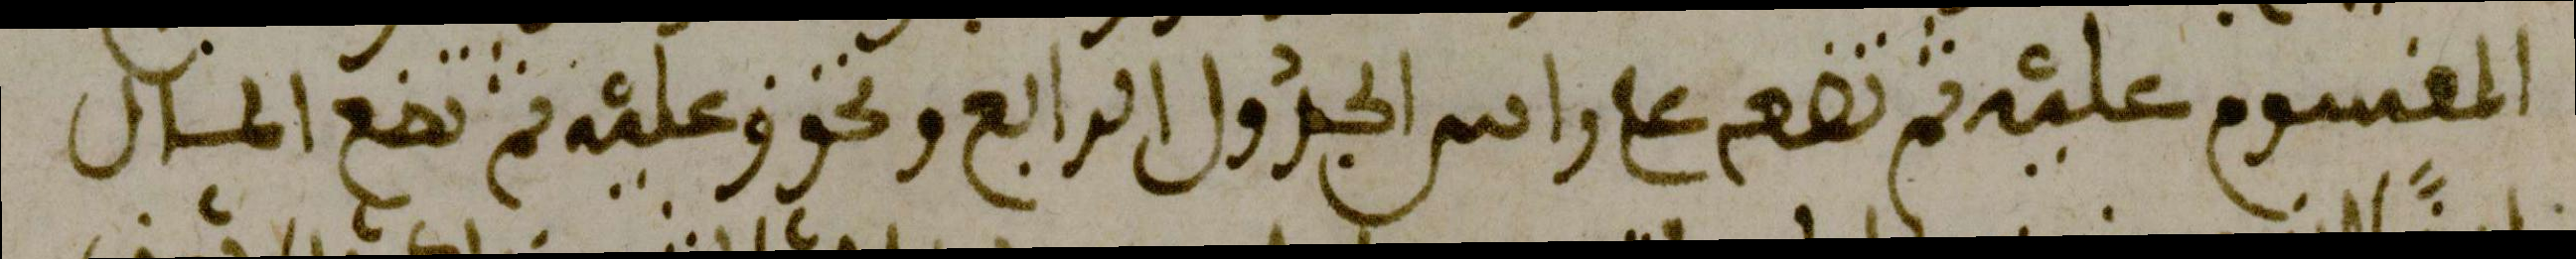المقسوم عليْه ثم تضعه على راس الجدول الرابع وتحوق عليْه ثم تضع المال
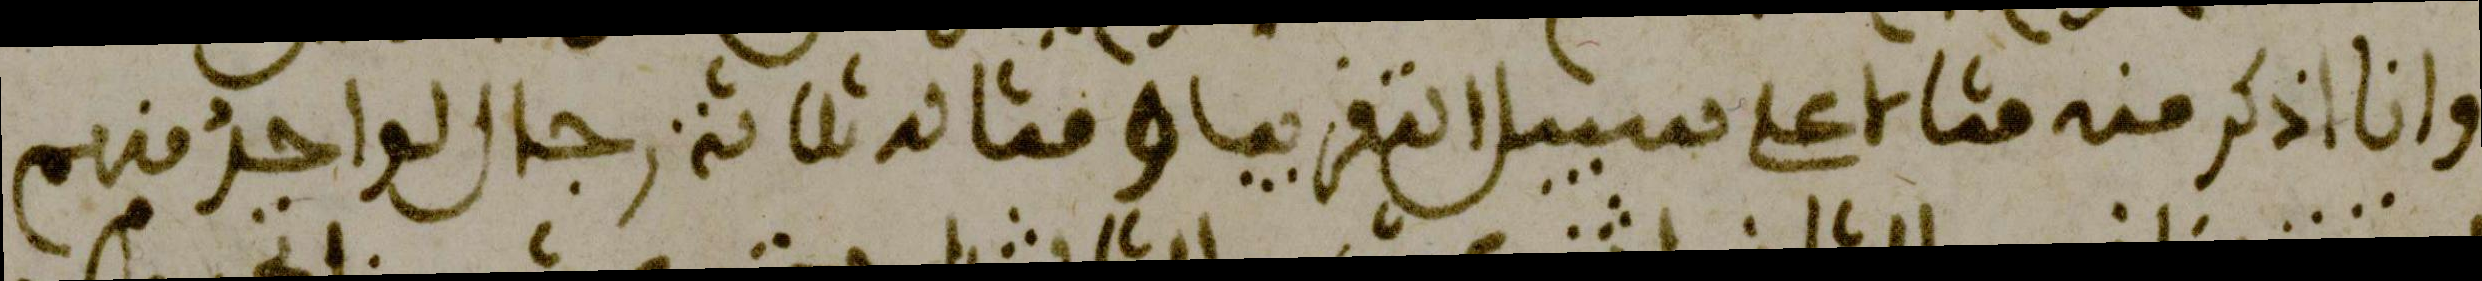وانا اذكر منه مثالا على سبيل التقريب ومثاله ثلاثة رجال لواحد منهم
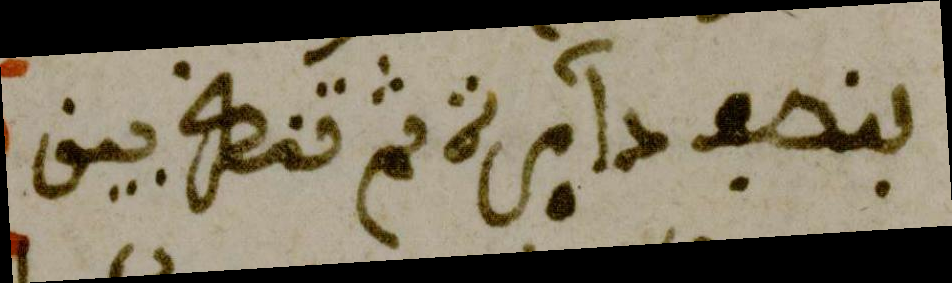بنصف دائرة ثم تنظر بين
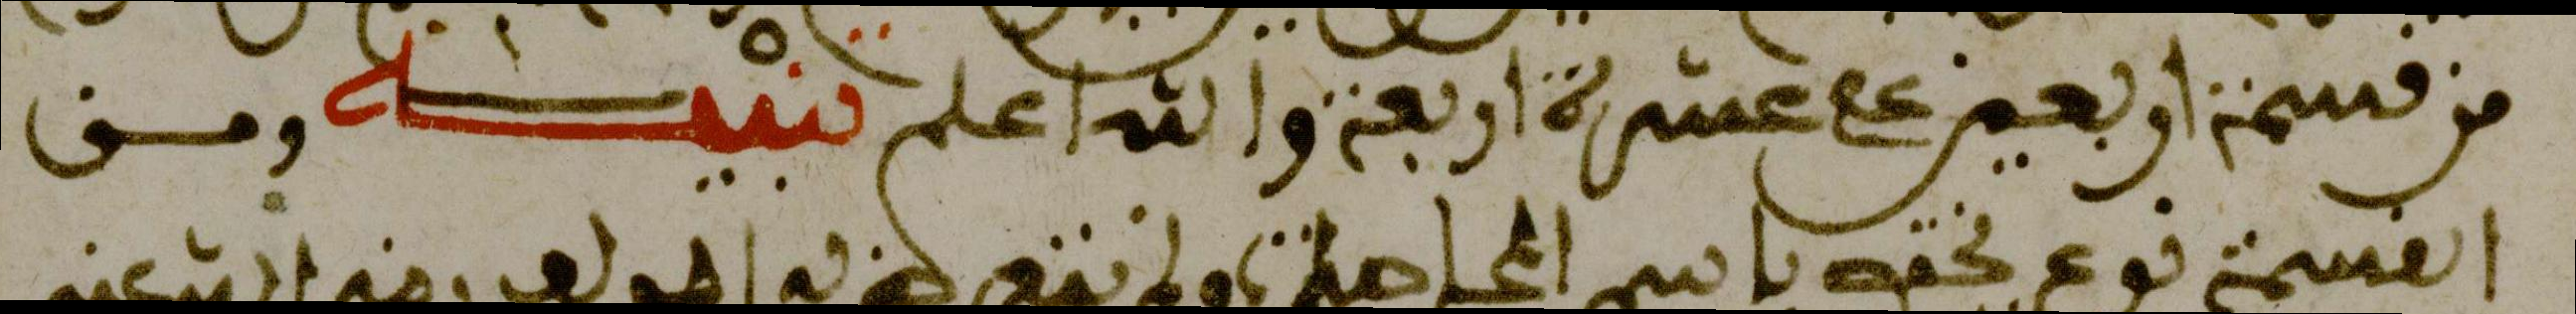من قسمة اربعين على عشرة اربعة والله اعلم تنْبيه ومن
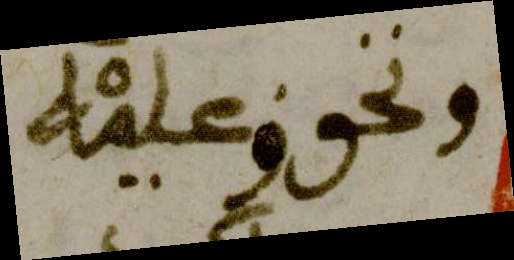وتحوق عليْه
